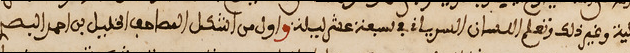نية وغير ذلك وتعلم اللسان السريانى في سبعة عشر ليلة اول من اشكل المصاحف الخليل بن احمد البصرى
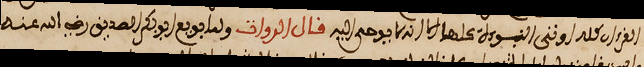القرءان كله اوتى النبوءة كلها الا انه لا يوحى اليه قال الروات ولما بويع ابو بكر الصديق رضي الله عنه
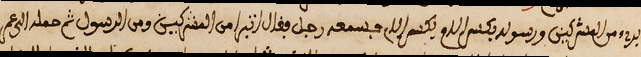برىء من المشركين ورسوله بكسر الام بكسر الام فسمعه رجل فقال اتبرا من المشركين ومن الرسول ثم حمله الى عمر
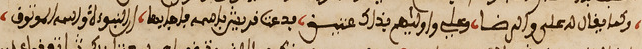وكما يقال له على والرضا وعلي واوليهم بذلك عتيق فدعت قريش باصمه فاجابها ان النبوءة واسمه الموتوق
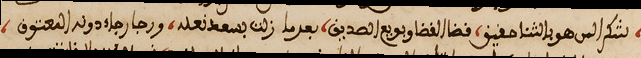شكرا لمن هو بالثنا حقيق فضا وبويع الصديق بعدما زلت بسعد نعله ورجا رجاء دوله المعتوق
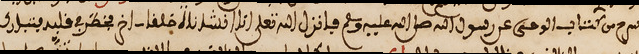سرح من كتاب الوحى عن رسول الله عليه وسلم فانزل الله تعلى انا انشدناه خلقات اخر فخظر في قلبه قتبارك
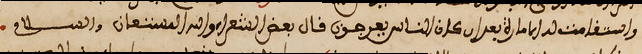استقامت له الامارة بعد ان كان الناس يعرجون قال بعض الشعراء والله المستعان والسلام
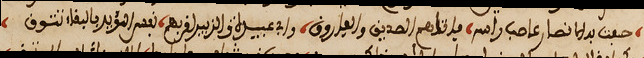حفت به الانصار عاصب راسه فاتاهم الصديق والفاروق وابى عبيدة والزبير لقربهم نفس المؤيد بالبقاء تتوق
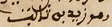ومن زيد بن ثابت
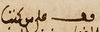قف على من كتب
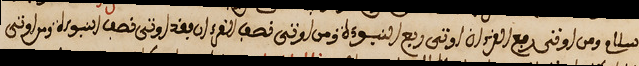سلام ومن اوتى رفع القرءان اوتى ربع النبوءة ومن اوتى نصف القرءان فقد اوتى نصف النبوءة ومن اوتى
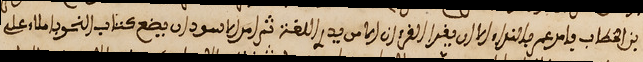بن الخطاب فامر عمر بالنداء ان الا من يدرى اللغة ثم امر الاسود ان يضع كتاب النحو باملاء على
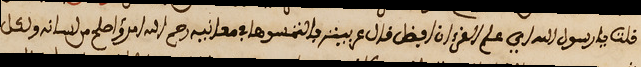قلت يا رسول الله اي علم القرءان افضل قال عربيته بالتمسوها في معاونيه رحم الله امرؤا صلح من لسانه ولكل
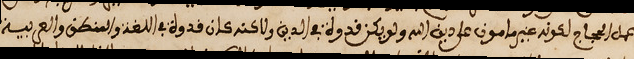عمل الحجاج لكونه غير مامون على دين الله ولو يكن قدرة في الدين ولاكنه كان قدوة في اللغة والمنطق والعربية
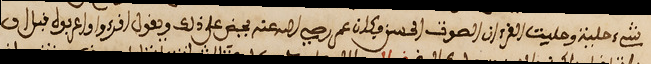شىء حلية وحليت القرءان الصوت الحسن فكان عمر رضي الله عنه يحض على ذلك ويقول اقرءوا واعربوه قبل ان
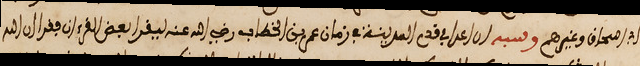ابى اسحاق وغيرهم وسبه ان اعرابى قدم المدينة في زمان عمر بن الخطاب رضي الله عنه ليقرا بعض القرءان فقرا ان الله
